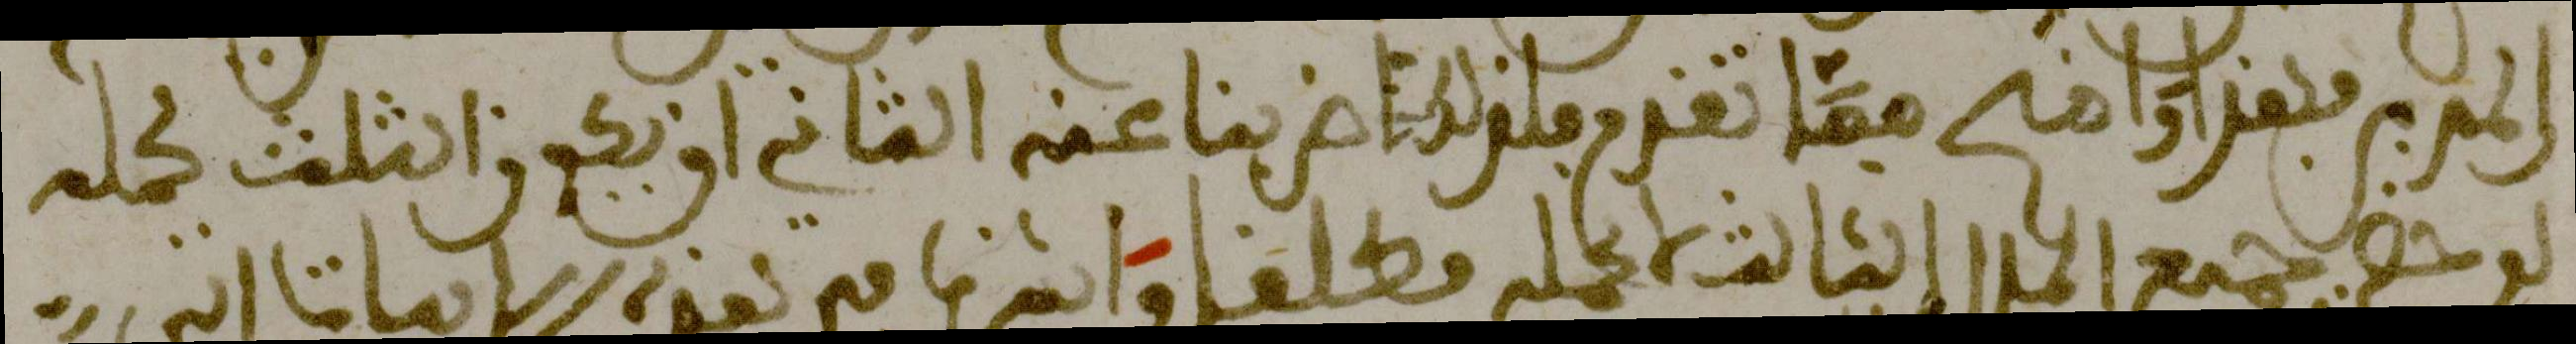المدبر فهذا وَاضح مِمَّا تقدم فلذلك اضر بنا عنه الثاني ان يكون الثلث يحمله
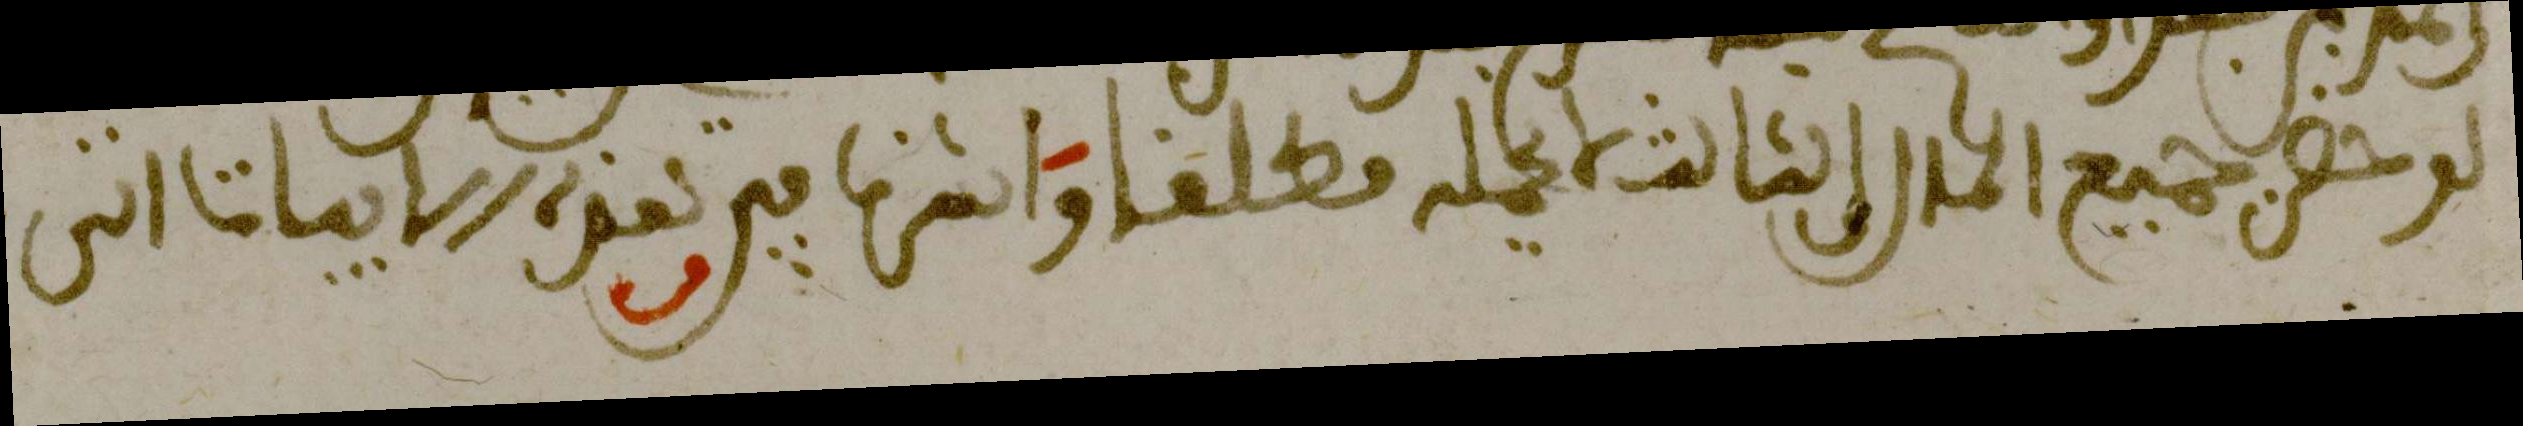لو حضر جميع المال الثالث لا يحمله مطلقا وَاشرن في هذه الابيات الى
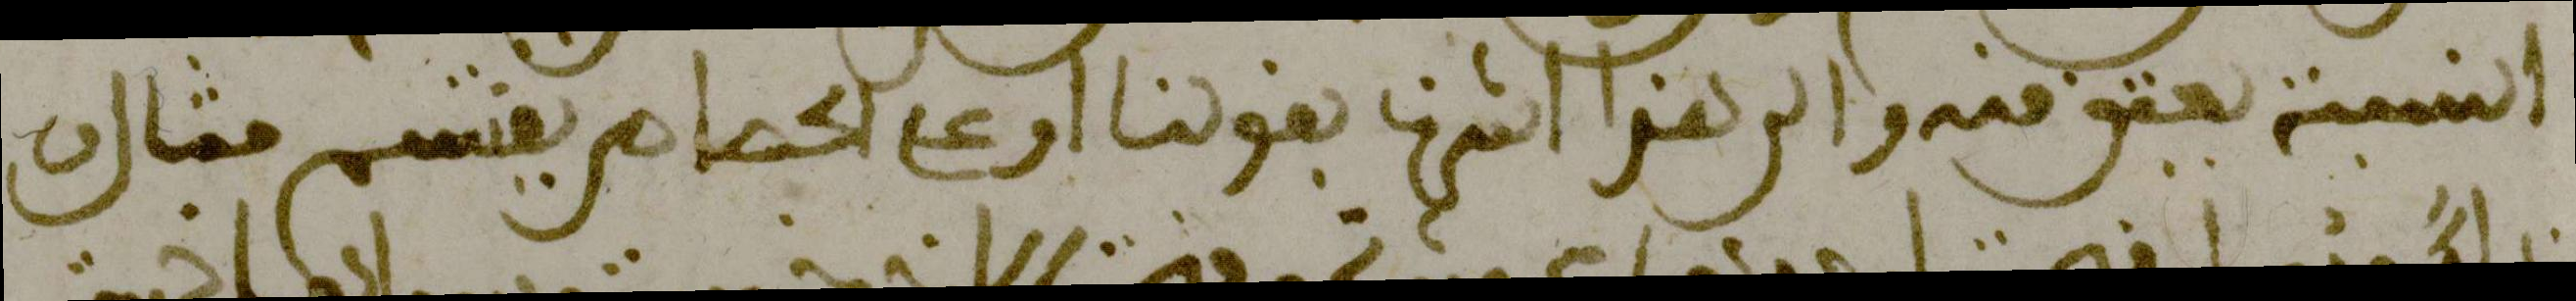النسبة يعتق منه والى هذا اشرن بقولنا او على الحصاص يقتسم مثال
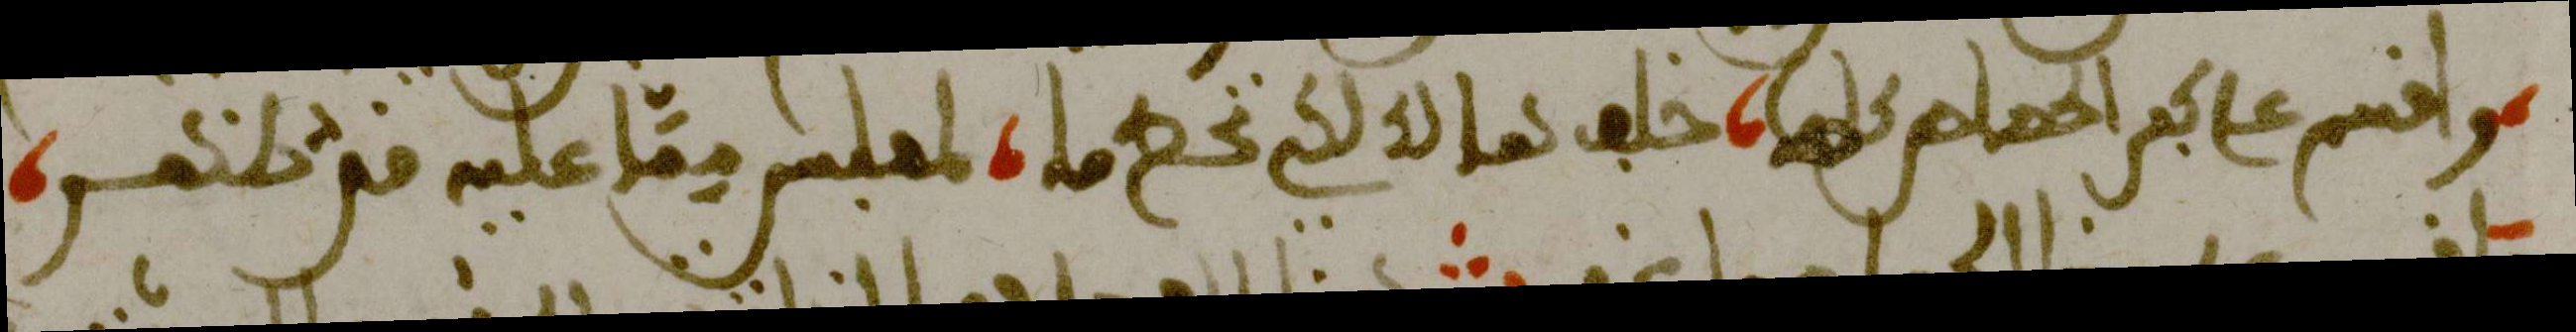واقسم على كبر الحصاص كلما خلف هالك لكي تحط ما المفلس مِمَّا عليه قذ ظهر
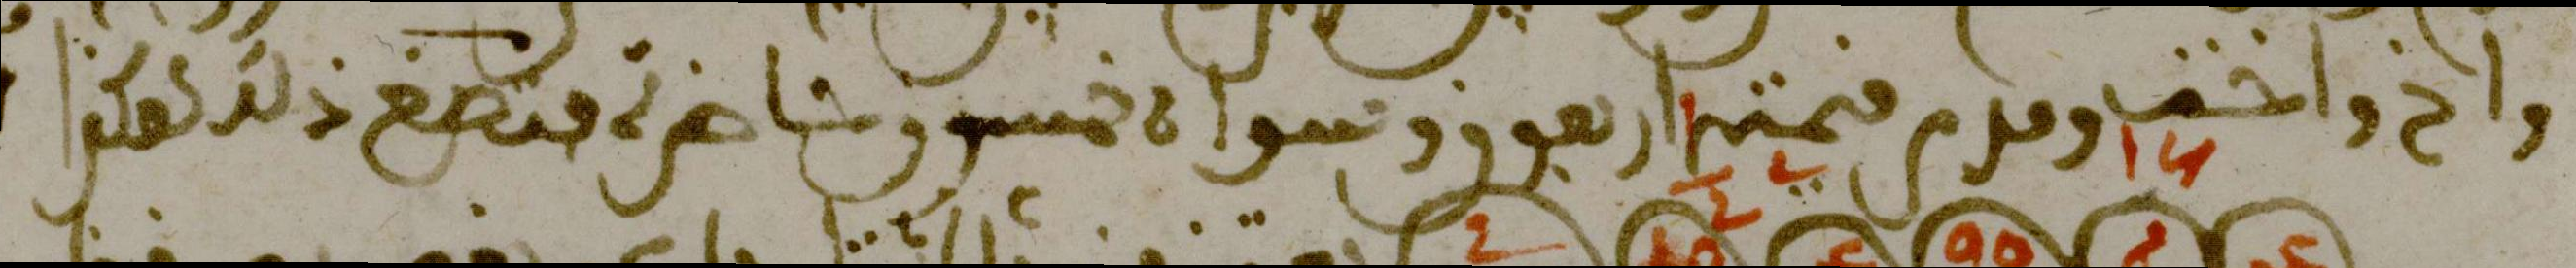واخ وواخت ومدبر قيمته اربعون وسواه خمسون حاضرة فتضع ذلك هكذا
